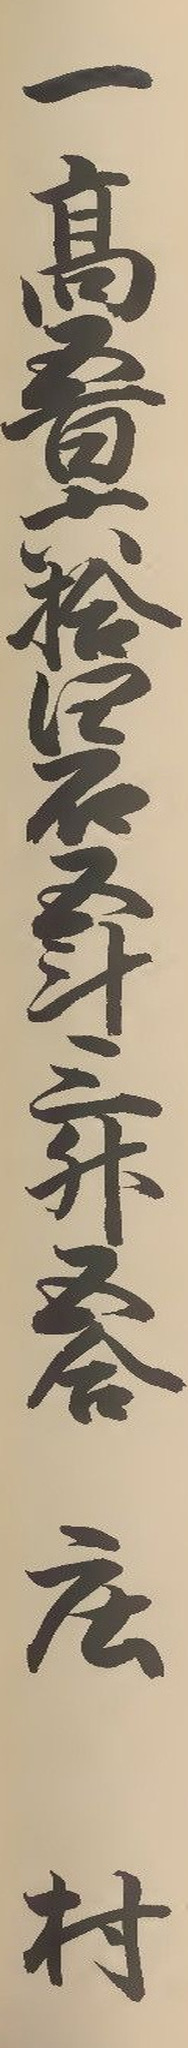一髙五百六拾四石五斗三升五合庄村
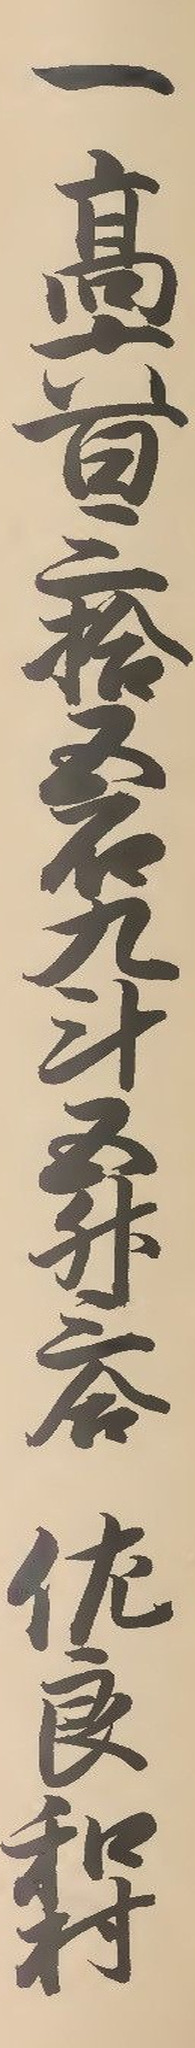一髙六百三拾五石九斗五升三合佐良和村
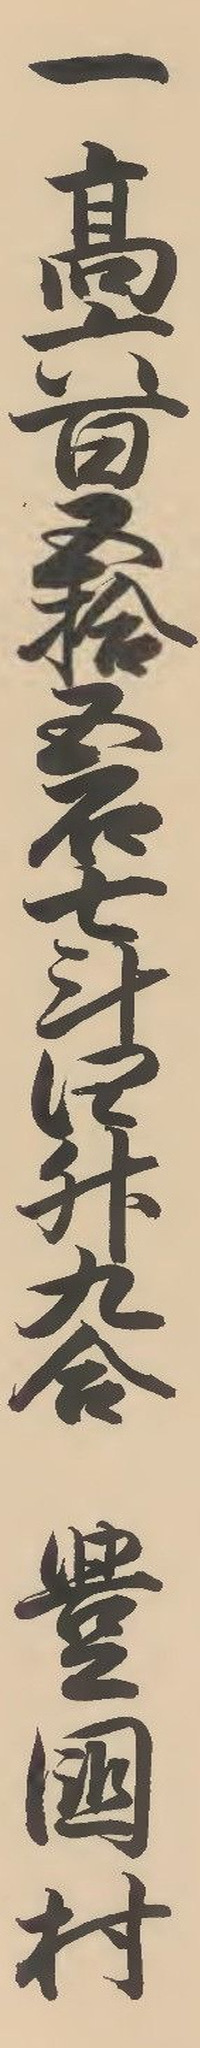一髙六百五拾五石七斗四升九合豊國村
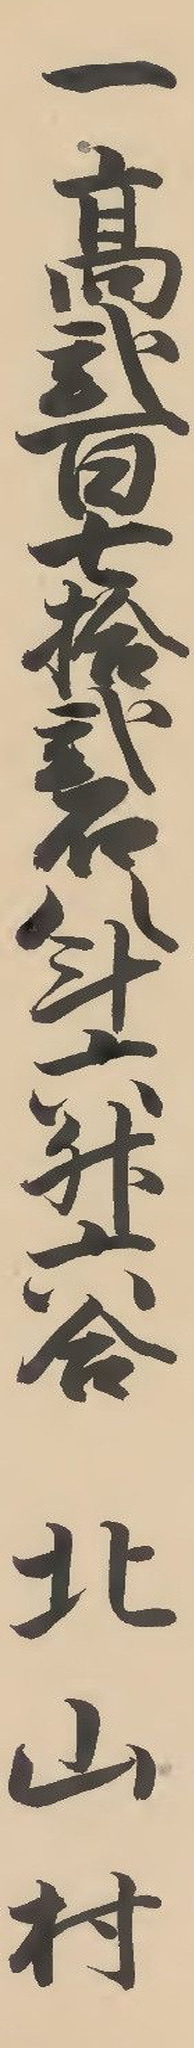一髙弐百七拾弐石八斗六升六合北山村
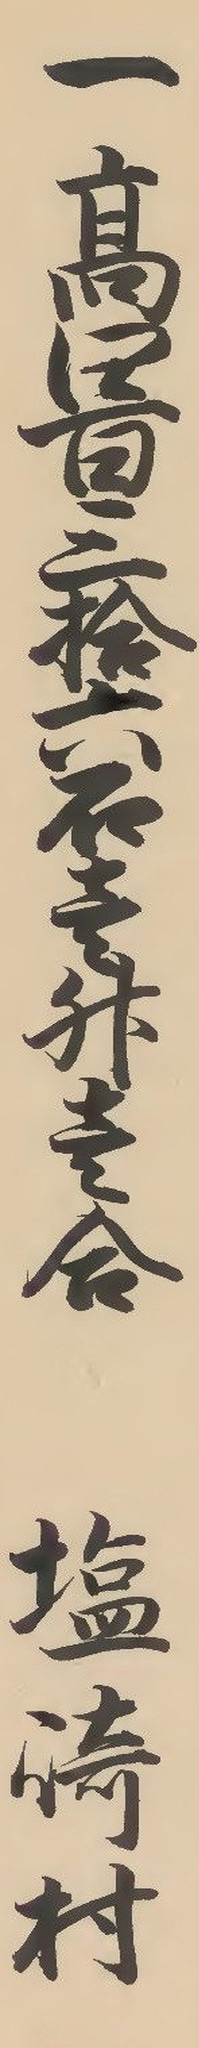一髙四百三拾六石壱升壱合塩崎村

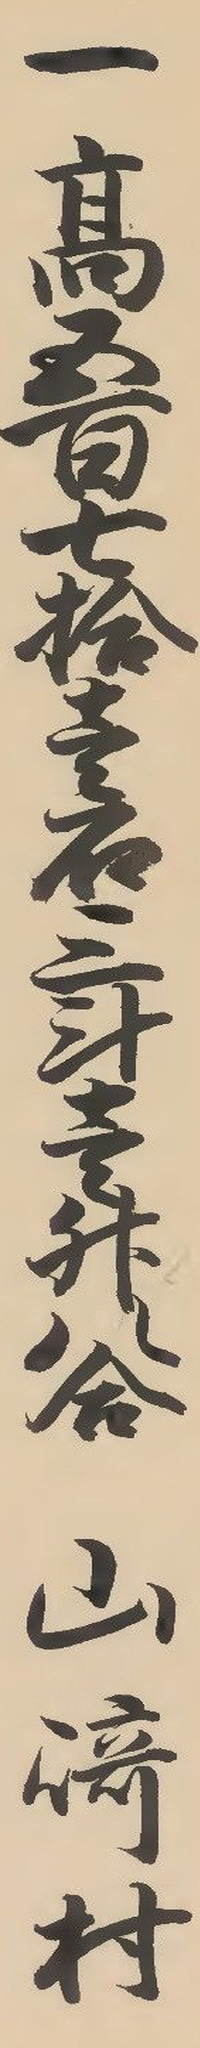一髙五百七拾壱石三斗壱升八合山崎村
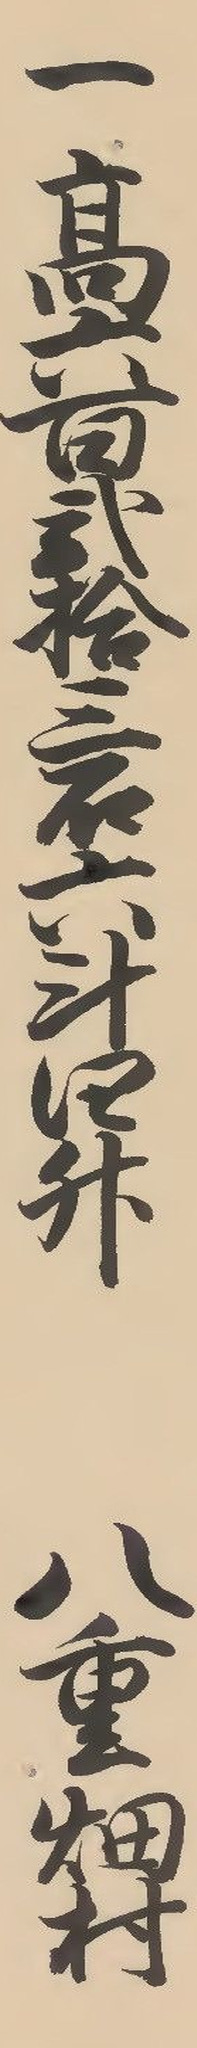一髙六百弐拾三石六斗四升八重畑村
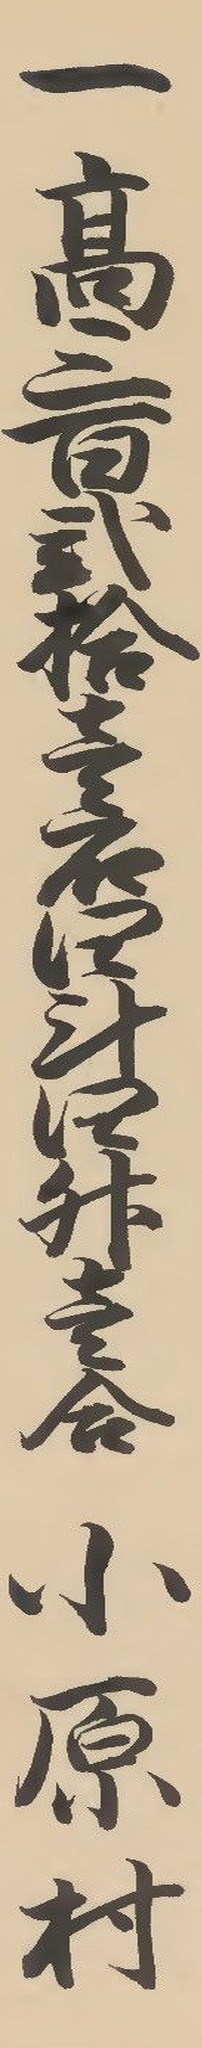一髙三百弐拾壱石四斗四升壱合小原村
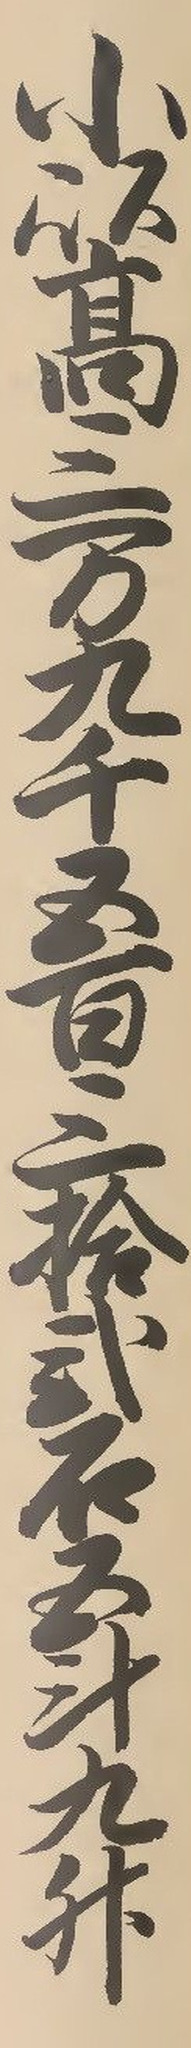小以髙三万九千五百三拾弐石五斗九升

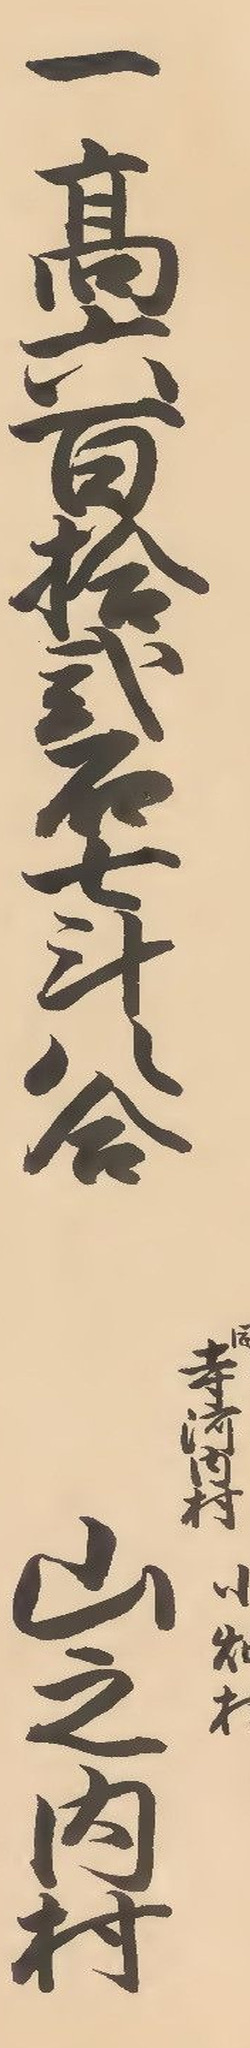一髙六百拾弐石七斗八合山之内村
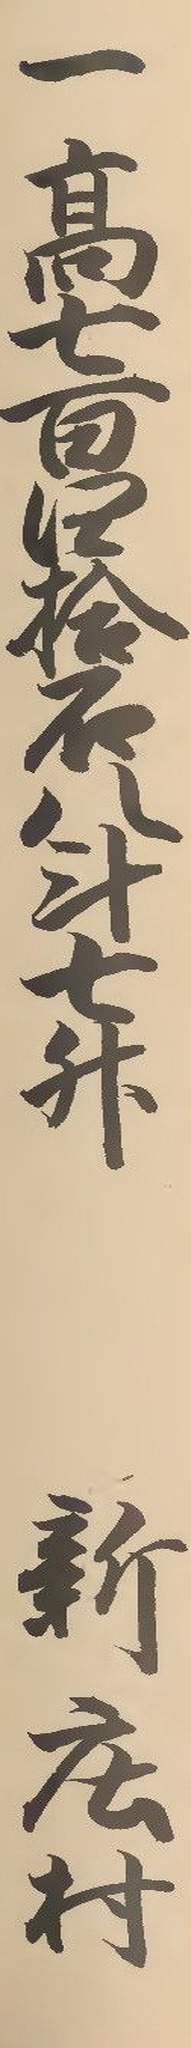一髙七百四拾石八升七合新庄村
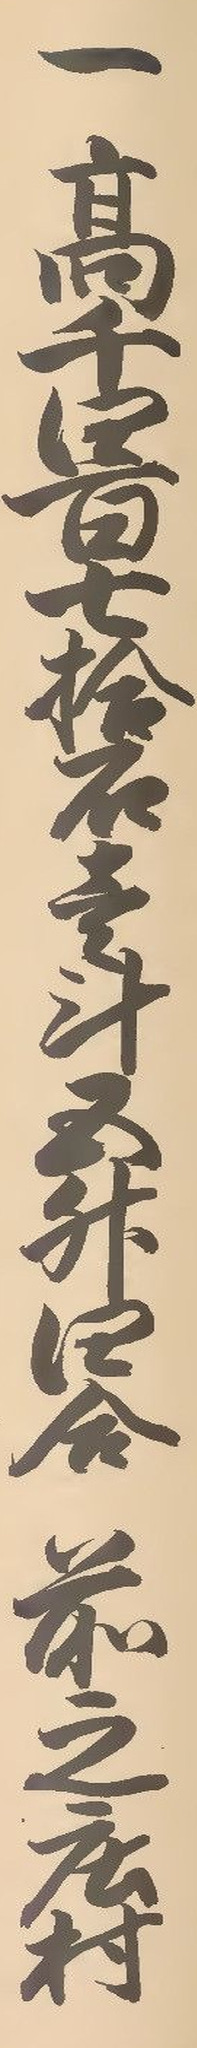一髙千四百七拾石壱斗五升四合前之庄村
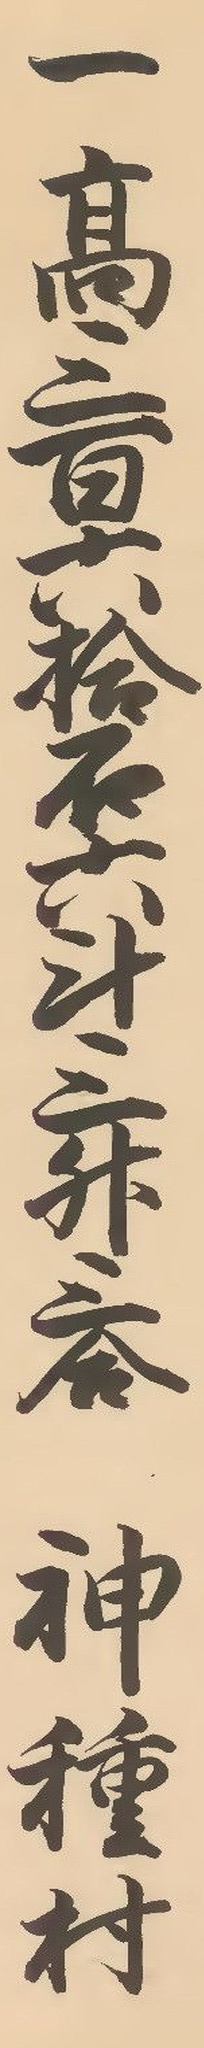一髙三百六拾石六斗三升三合新種村
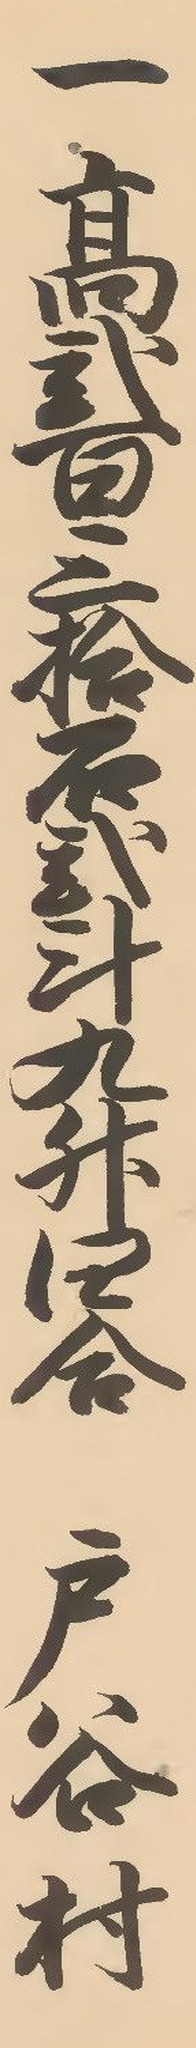一髙弐百三拾石弐斗九升四合戸谷村
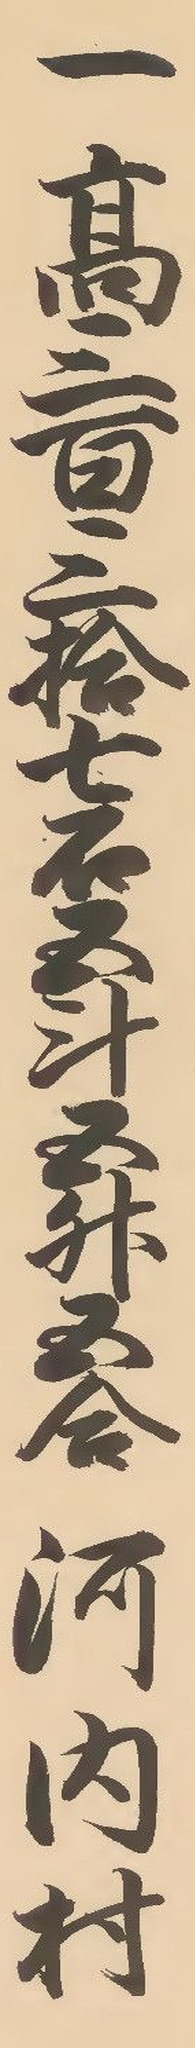一髙三百三拾七石五斗五升五合河内村

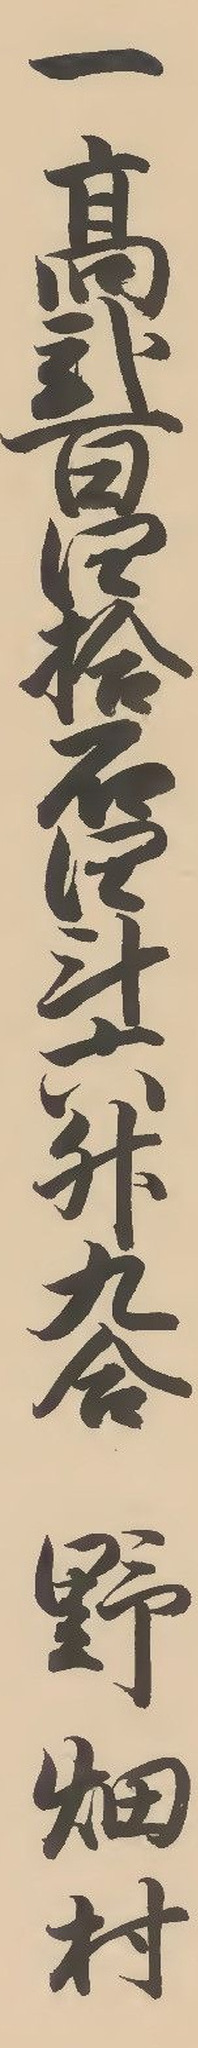一髙弐百四拾石四斗六升九合野畑村
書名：播磨国郷帳
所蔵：国立公文書館 National Archives of Japan
